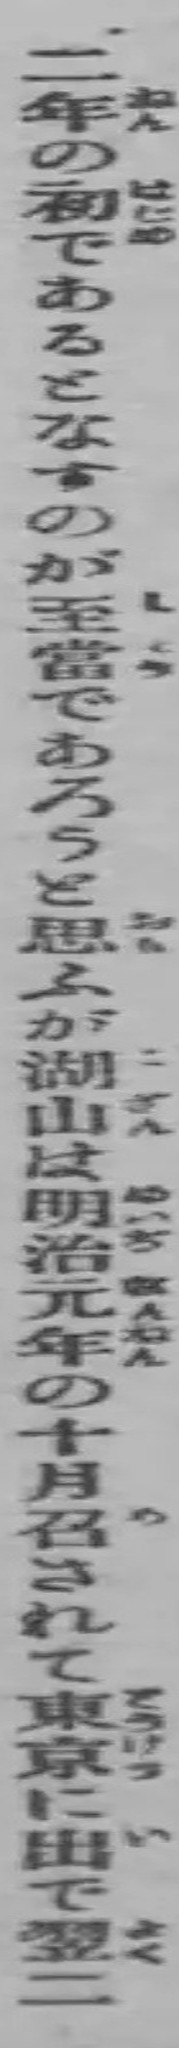二年の初であるとなすのが至当であろうと思ふが湖山は明治元年の十月召されて東京に出で翌二
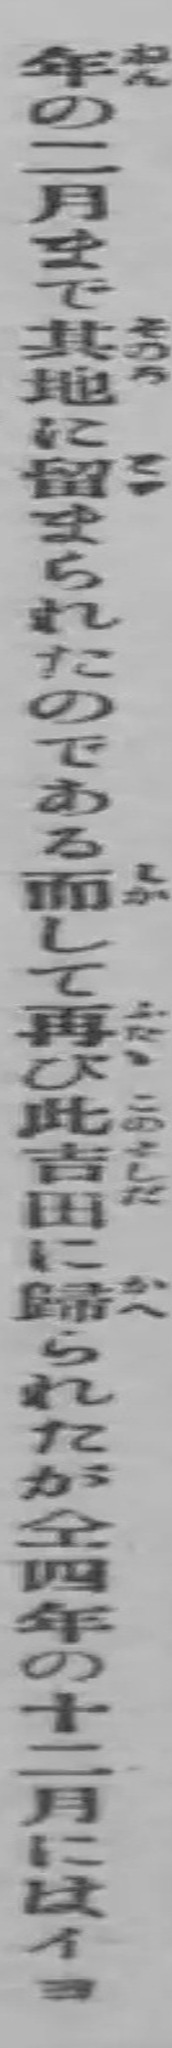年の二月まで其地に留まられたのである而して再び此吉田に帰られたが仝四年の十二月にはイヨ
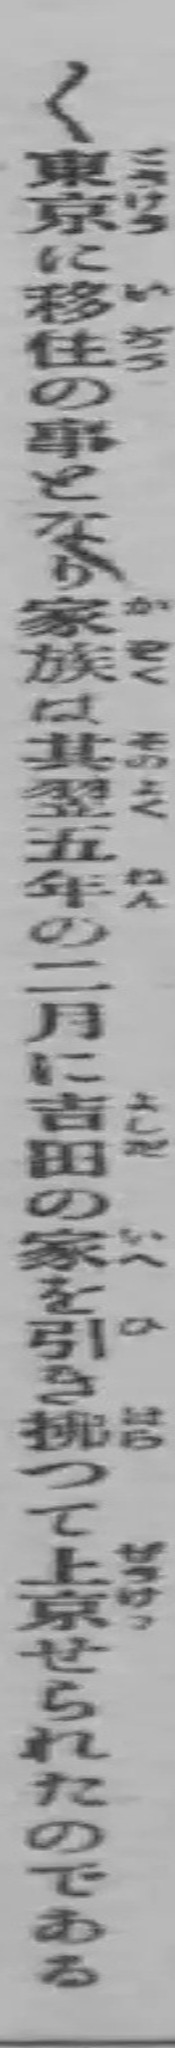〳〵東京に移住の事となり家族は其翌五年の二月に吉田の家を引き払つて上京せられたのである
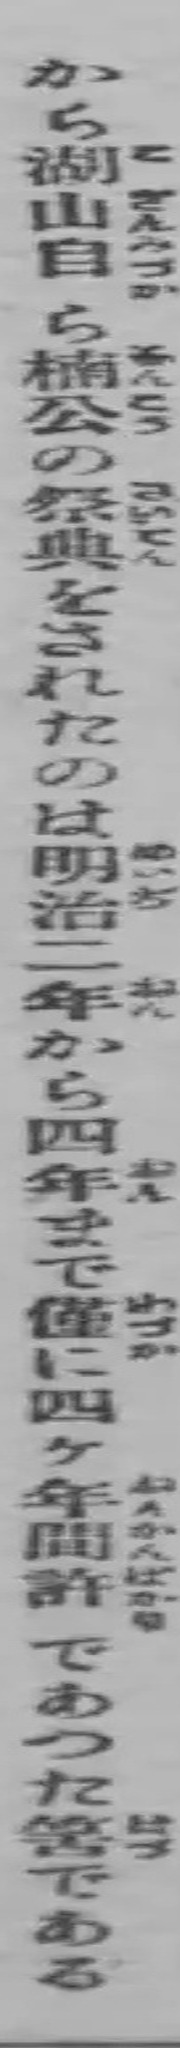から湖山自ら楠公の祭典をされたのは明治二年から四年まで僅に四ケ年間許であつた筈である
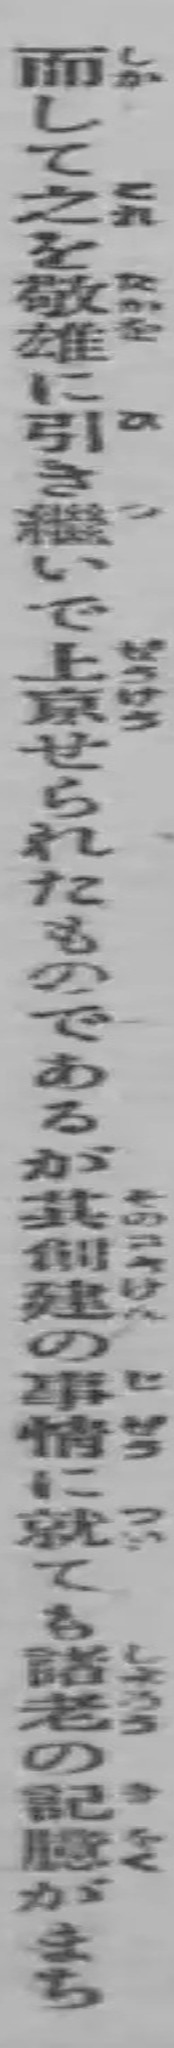而して之を敬雄に引き継いで上京せられたものであるが其創建の事情に就ても諸老の記憶がまち
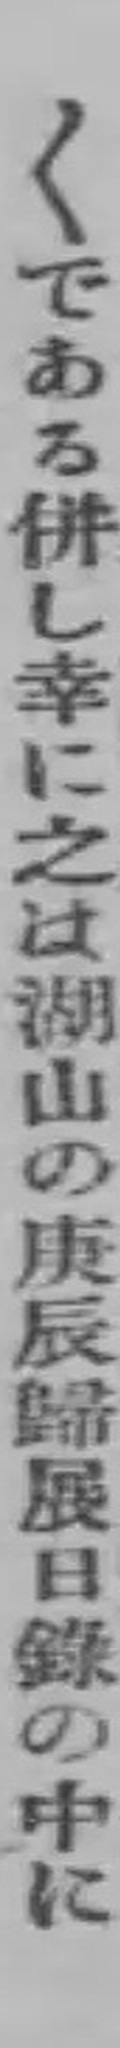〳〵である併し幸に之は湖山の庚辰帰展日録の中に
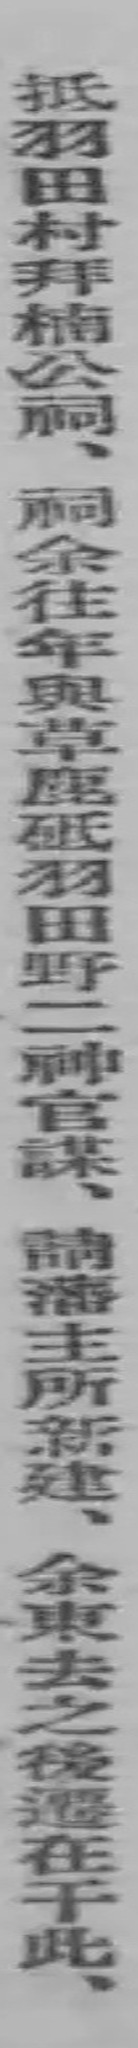抵羽田村拝楠公祠、祠余往年與草鹿砥羽田野二神官謀、請藩主所新建、余東去之後遷在干此、
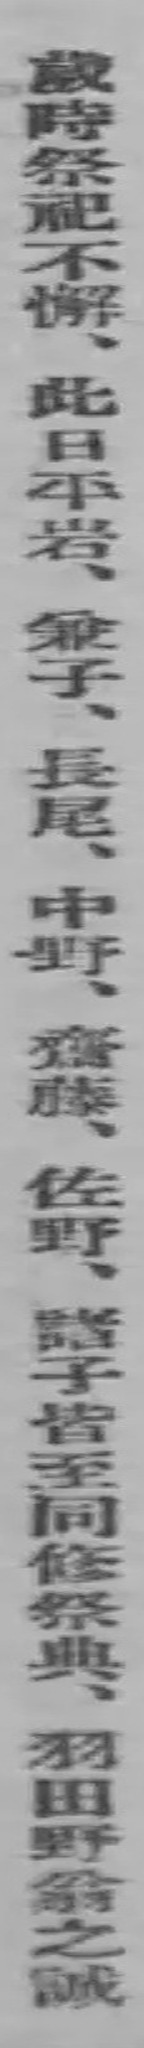歳時祭祀不懈、此日平岩、兼子、長尾、中野、齋藤、佐野、諸子皆至同修祭典、羽田野翁之誠
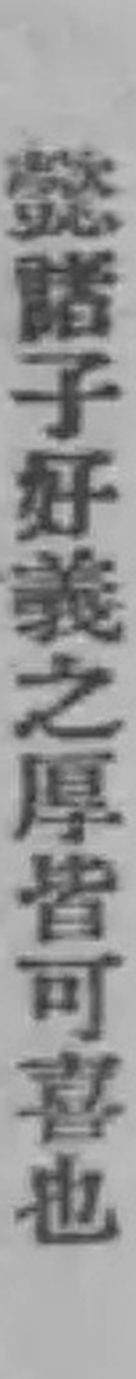懿諸子好義之厚皆可喜也

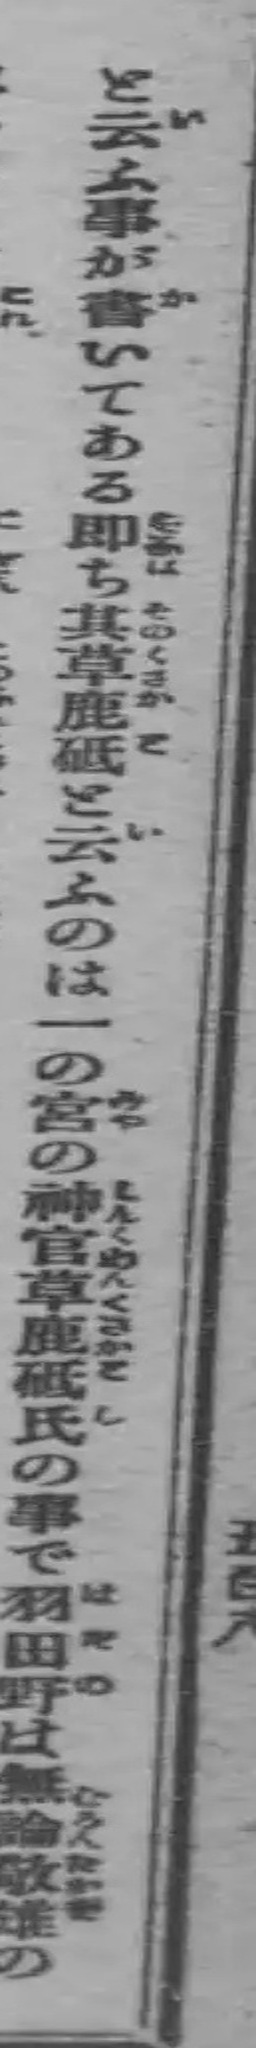と云ふ事が書いてある即ち其草鹿砥と云ふのは一の宮の神官草鹿砥氏の事で羽田野は無論敬雄の
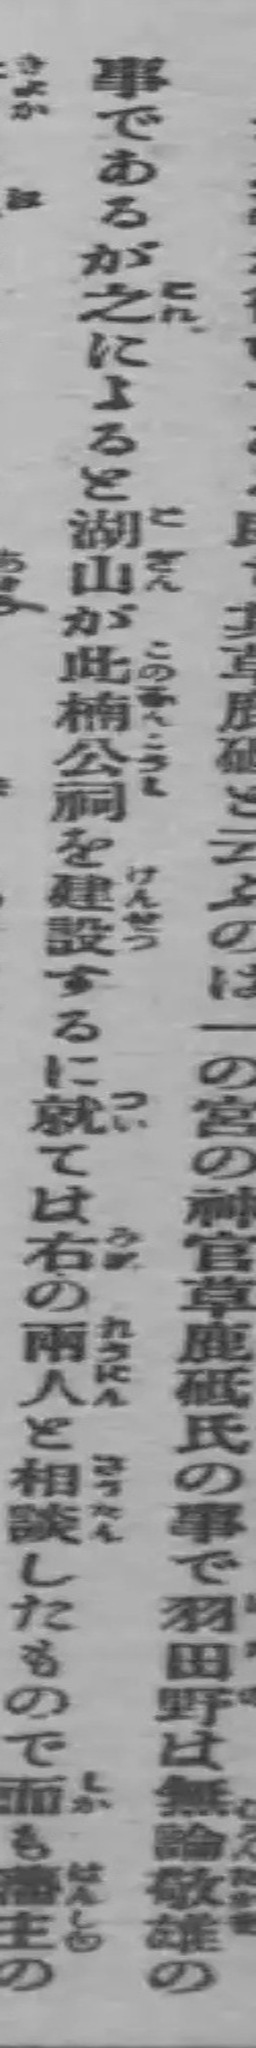事であるが之によると湖山が此楠公祠を建設するに就ては右の両人と相談したもので而も藩主の
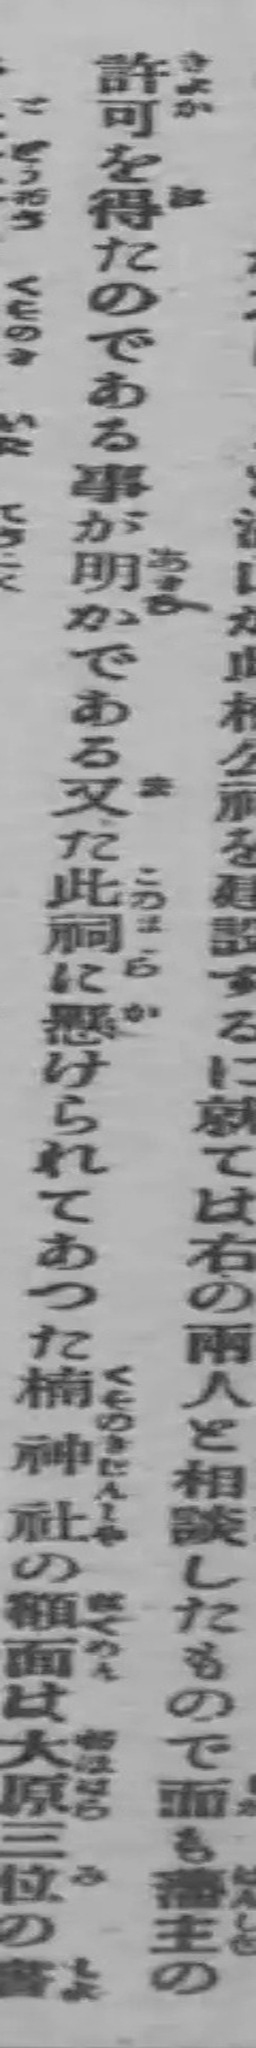許可を得たのである事が明かである又た此祠に懸けられてあつた楠神社の額面は大原三位の書
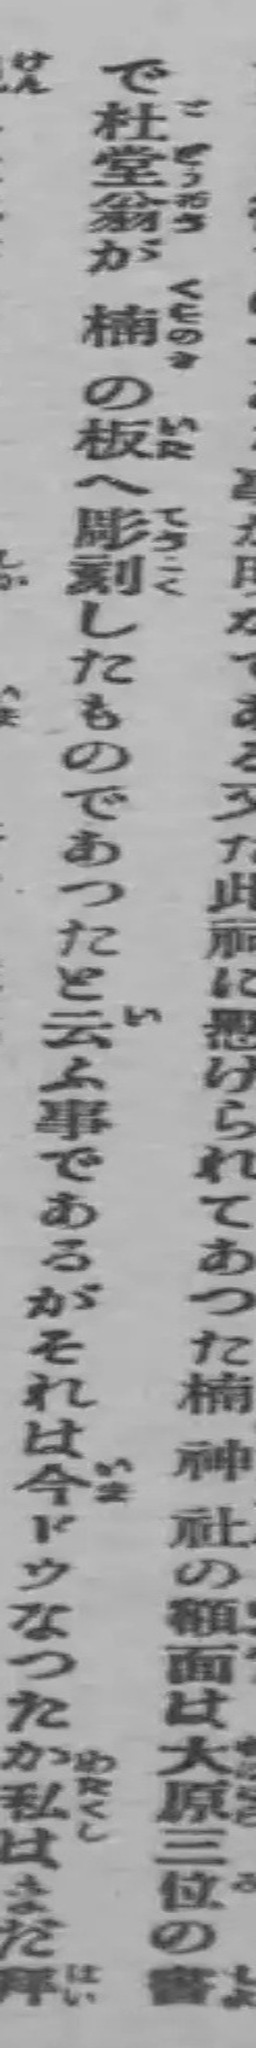で杜堂翁が楠の板へ彫刻したものであつたと云ふ事であるがそれは今ドウなつたか私はまだ拝
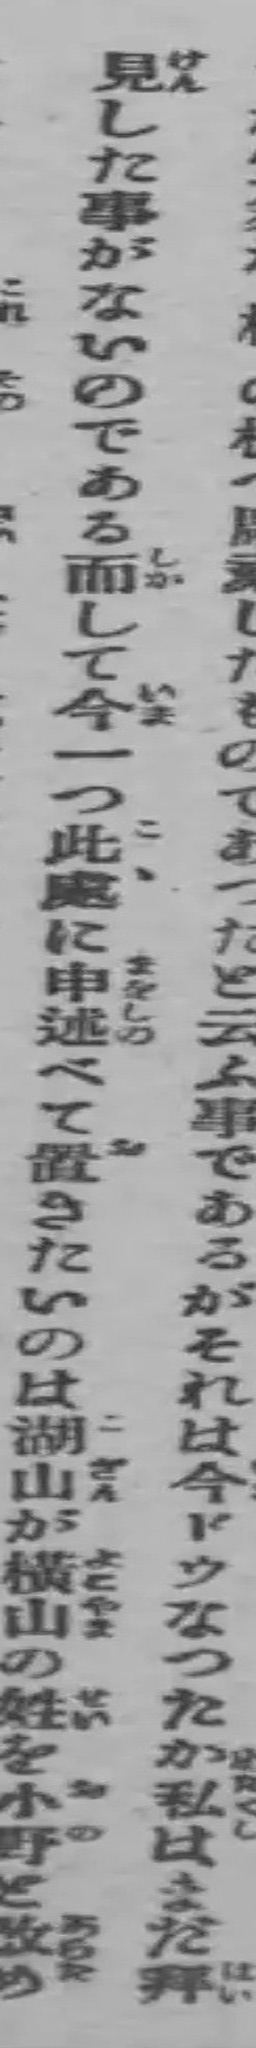見した事がないのである而して今一つ此処に申述べて置きたいのは湖山が横山の姓を小野と改め
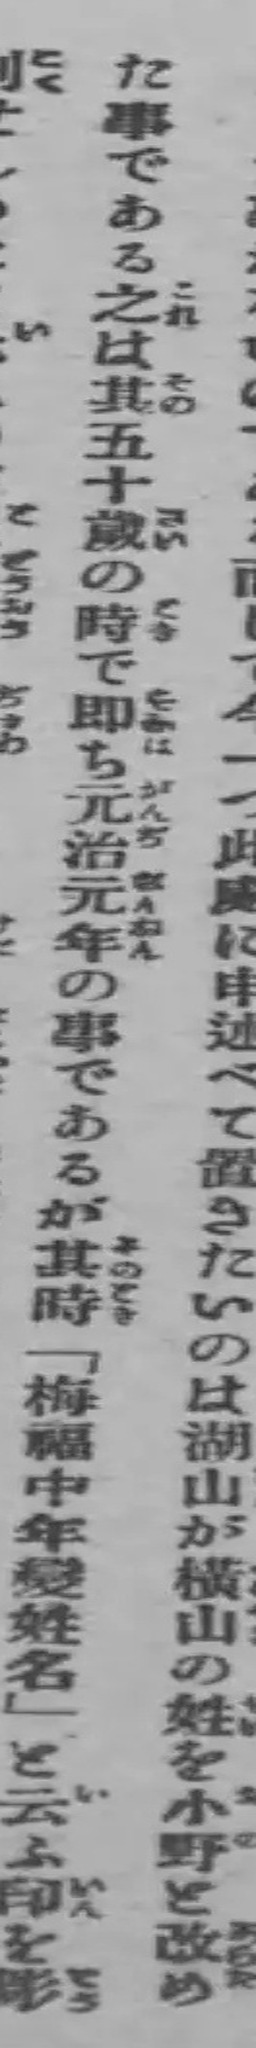た事である之は其五十歳の時で即ち元治元年の事であるが其時「梅福中年変姓名」と云ふ印を彫
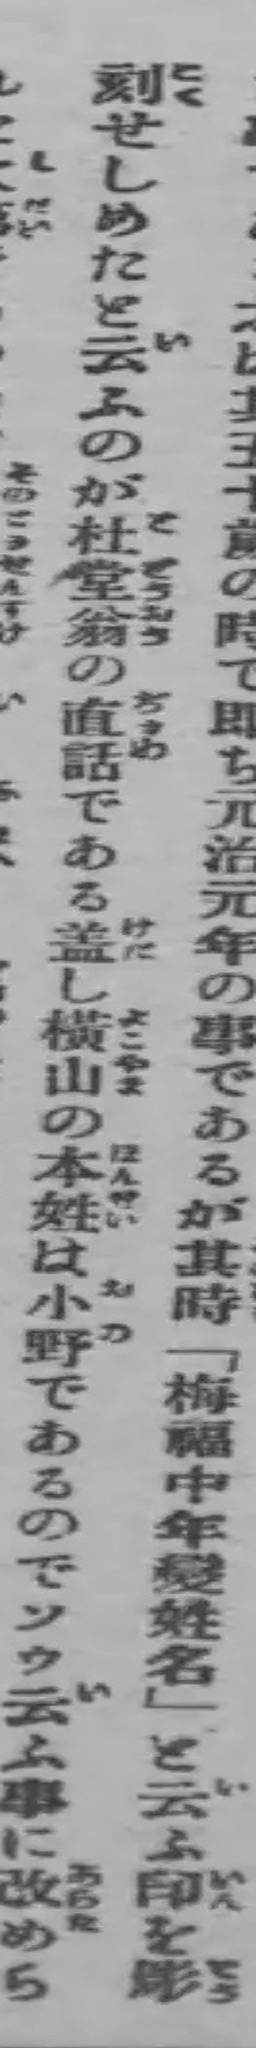刻せしめたと云ふのが杜堂翁の直話である蓋し横山の本姓は小野であるソウ云ふ事に改めら
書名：豊橋市史談
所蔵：国立国会図書館 National Diet Library, JAPAN
